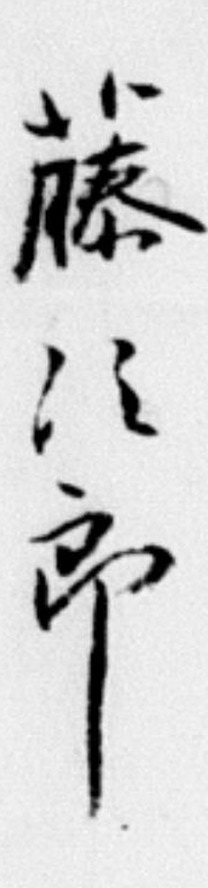藤次郎
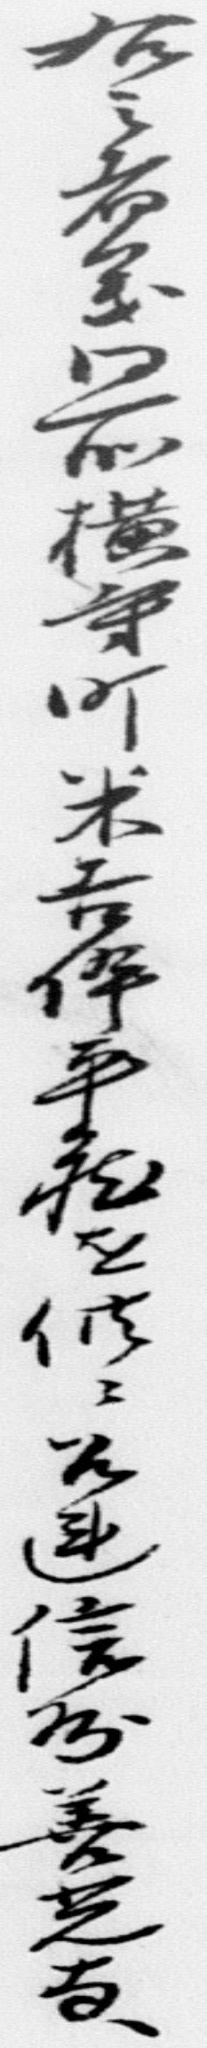右之者義同所横寺町米吉忰平蔵を供に召連信州善光寺へ
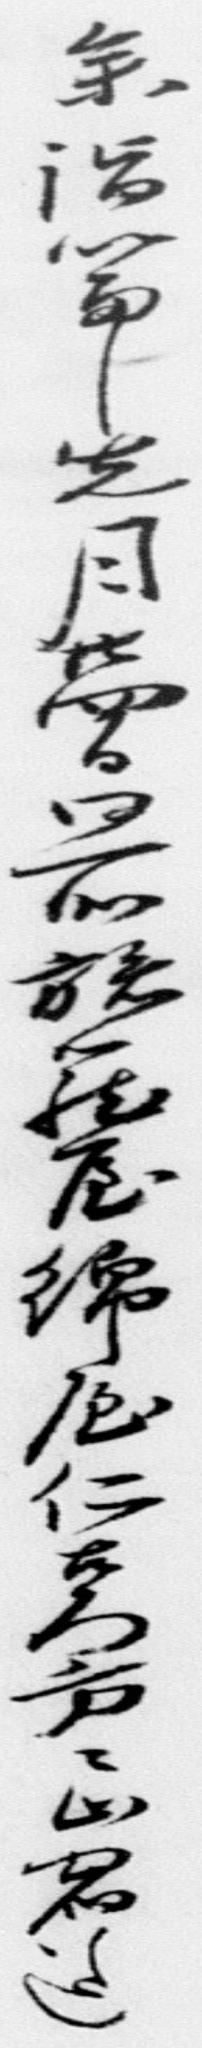参詣いたし先月廿四日同所旅籠屋綿屋仁左衛門方に止宿いたし
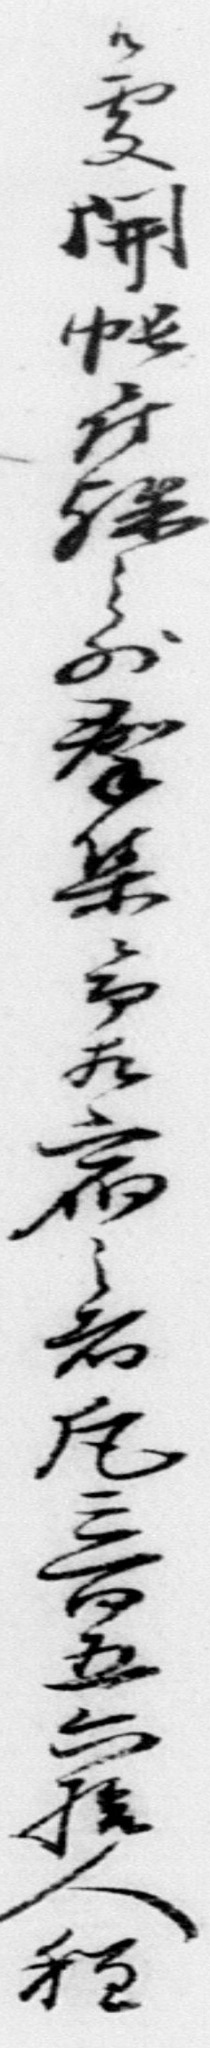候処開帳に付殊之外群集に而相宿之者凡三百五六拾人程
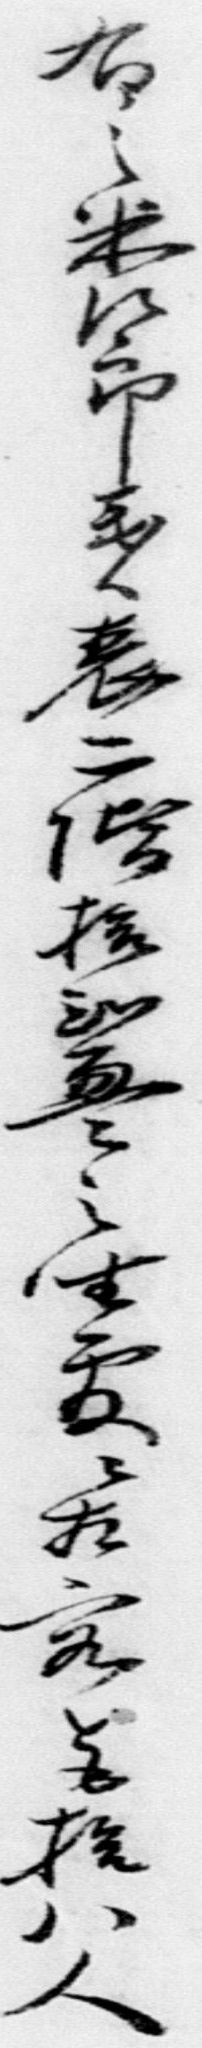有之米次郎義は表二階拾弐疊の座敷に相客とも拾八人
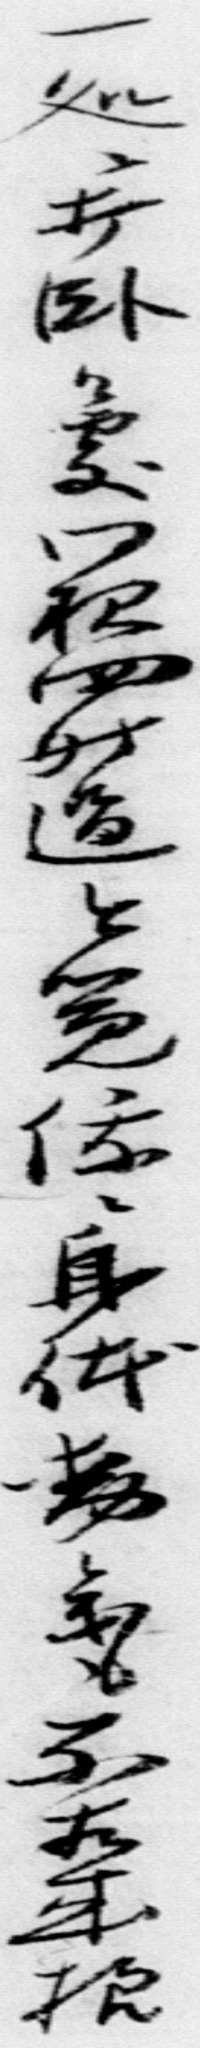一処に打卧候処同夜四時過と覚俄に身体動候義も不相成様
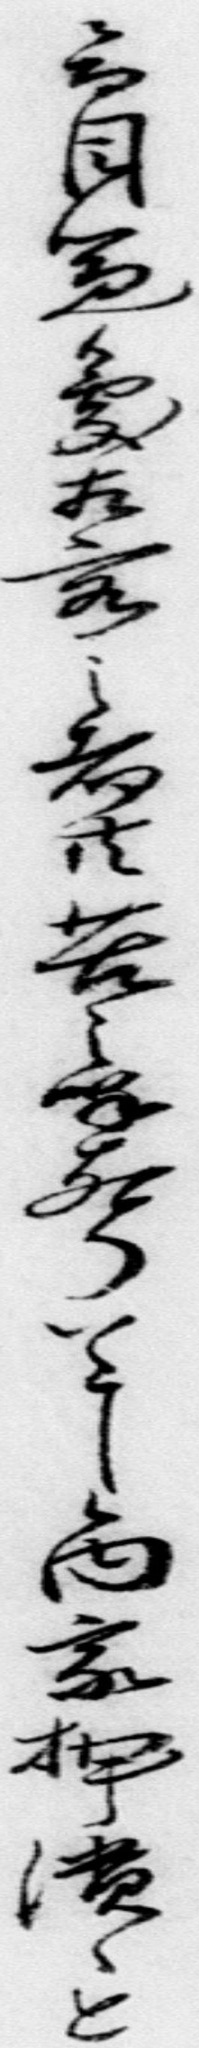に而目覚候処相客之者共苦之呼声いたし候内家押潰候と

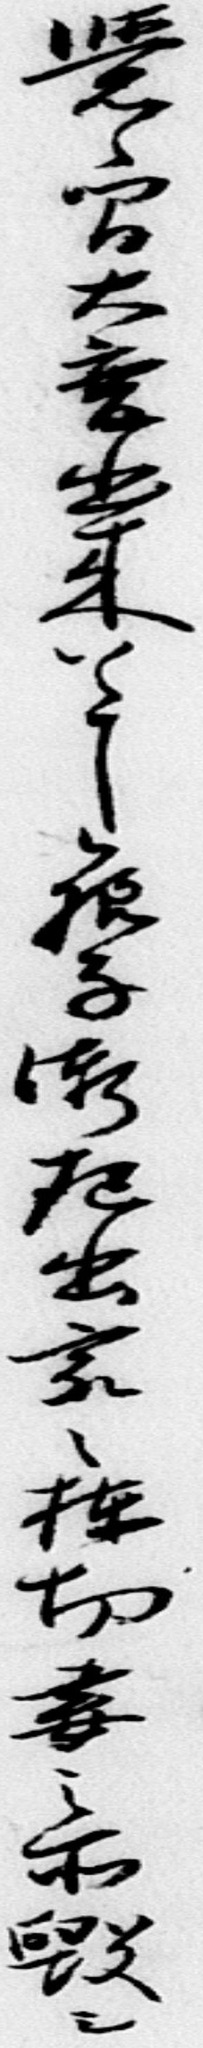覚候間大変出来いたし候様子漸起出家之棟切妻之所毀し
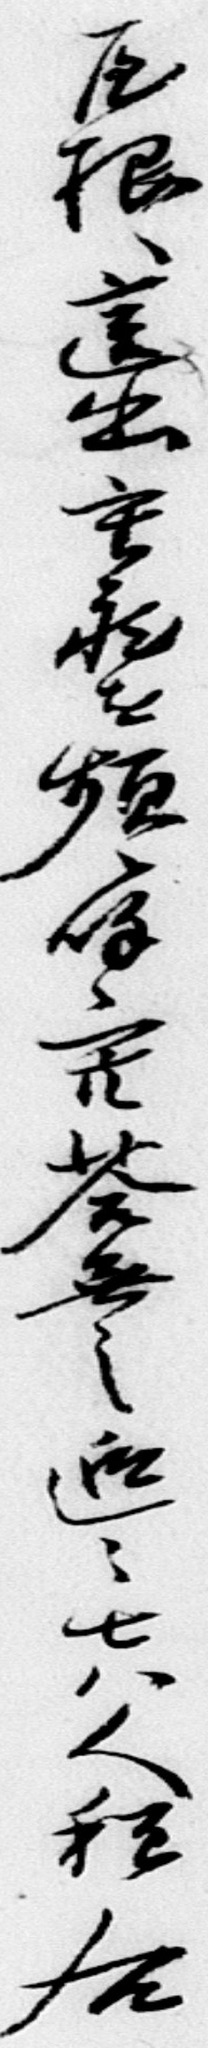屋根へ這出重蔵を頻に呼候へ共答無之追々七八人程右
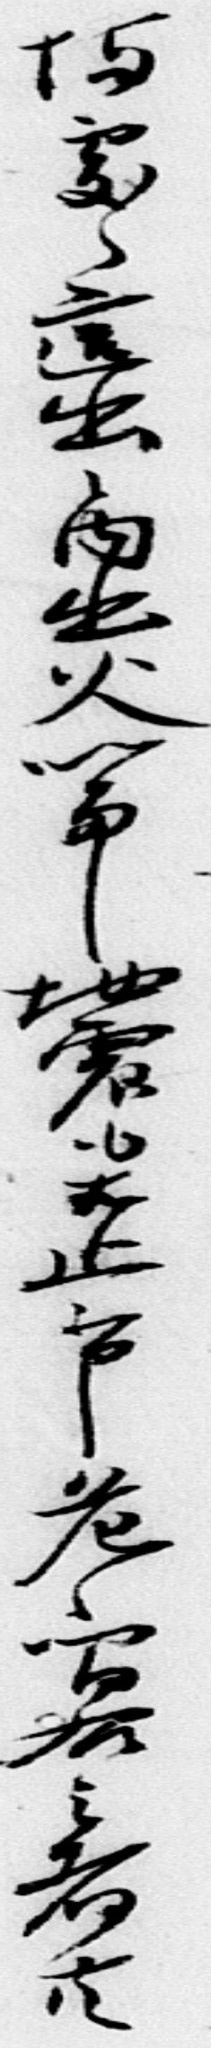場処へ這出候内出火いたし地震も相止不申危候間右之者共
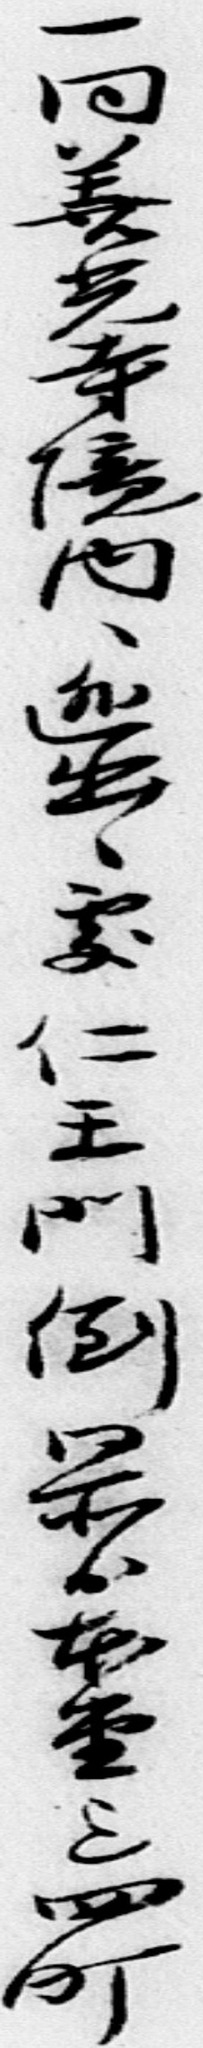一同善光寺境内へ逃出候処仁王門倒同所ゟ本堂迄四町
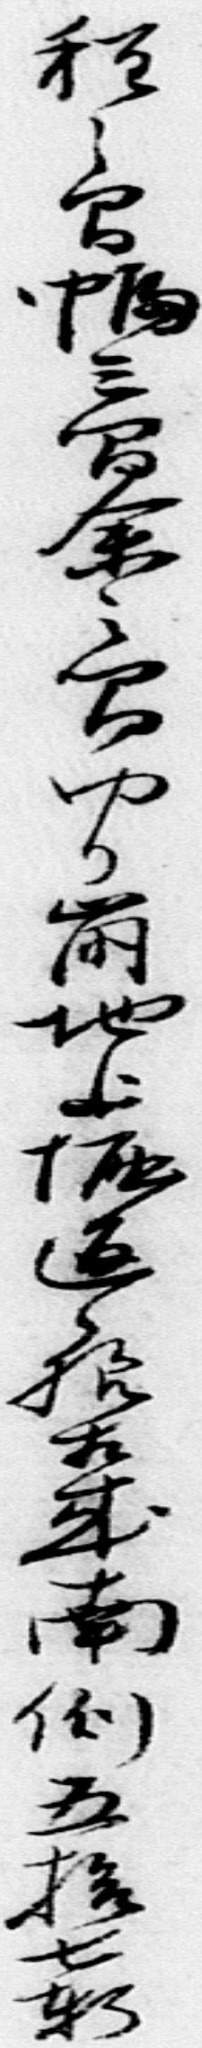程之間幅三間余之間ゆり崩地上堀返候様相成南側五拾七軒
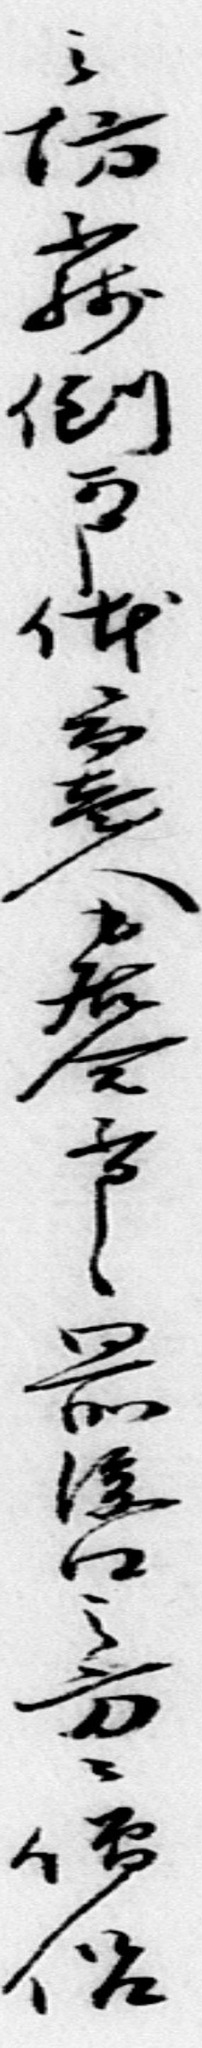之坊不残倒可申体に而壱人も居合不申候同所後口之方に僧侶
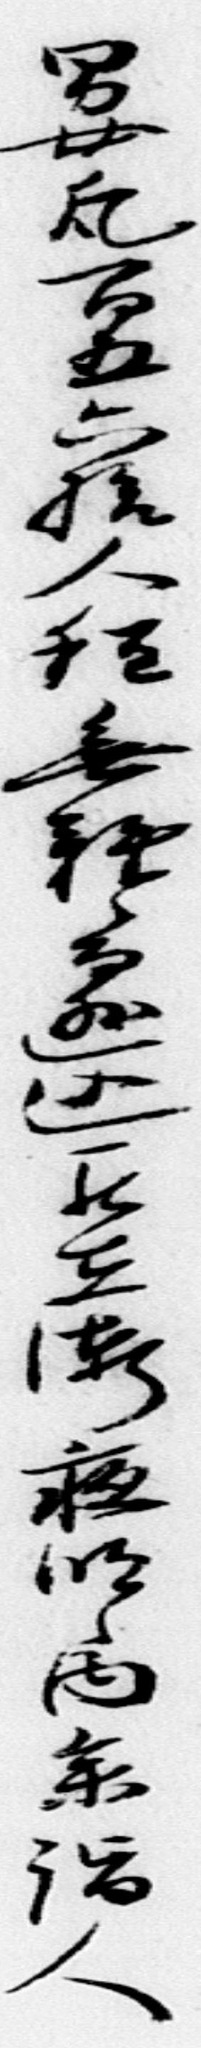男女凡百五六拾人程無難に而逃込罷在漸夜明之内参詣人
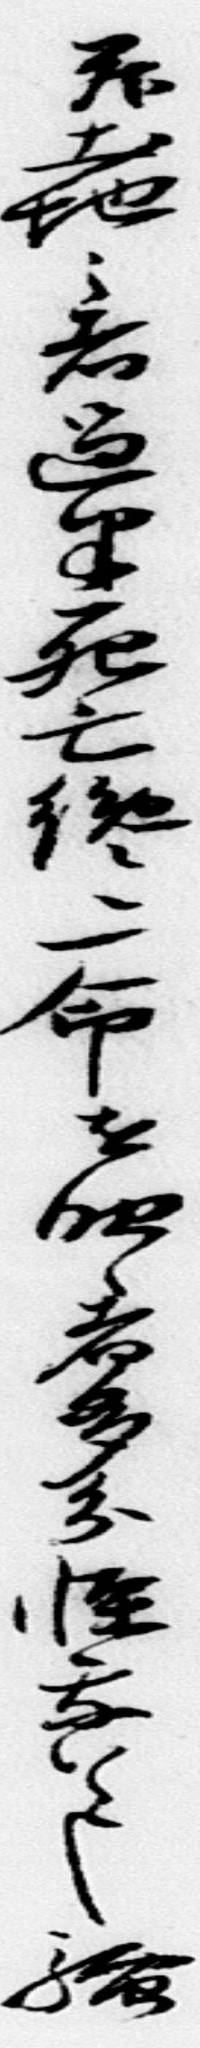幷土地之者過半死亡纔に一命を助候者多分怪我いたし騒
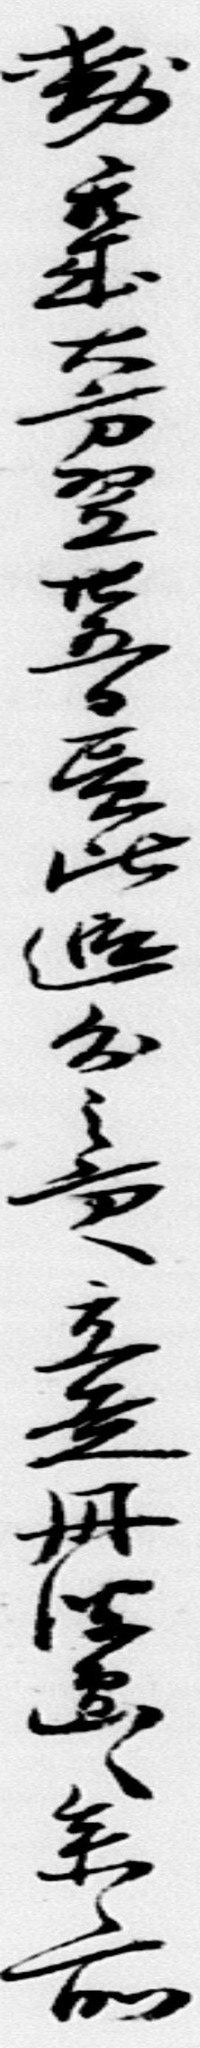動に相成大方翌廿五日昼頃追分之方へ立走丹波島へ参候所
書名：信州大地震一件
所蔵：徳島県立図書館
